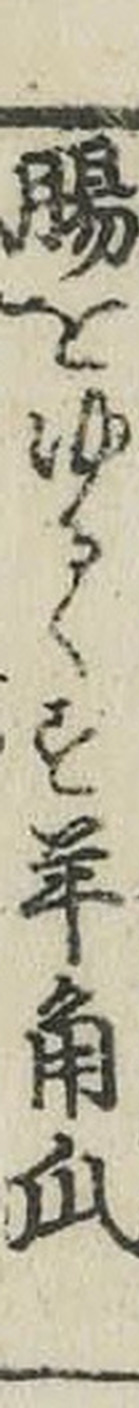腸をゆるくす羊角瓜
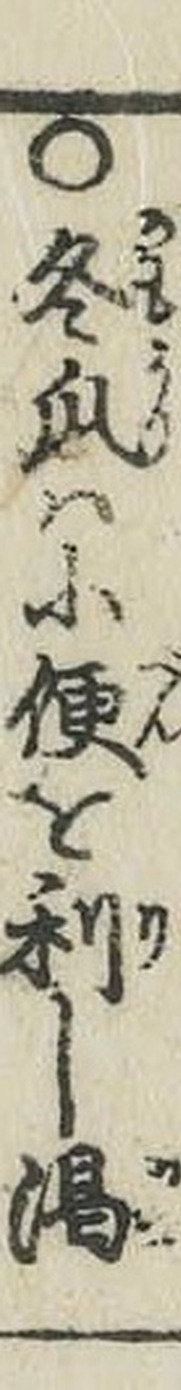○冬瓜は小便を利し渇
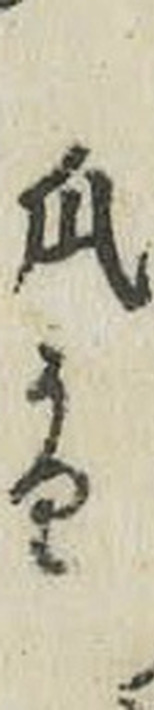瓜うり
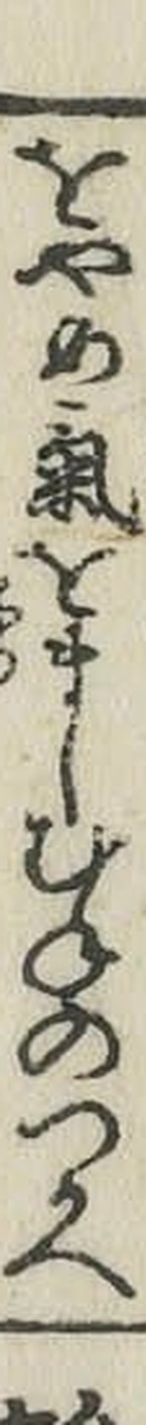をやめ気をましむねのつかへ
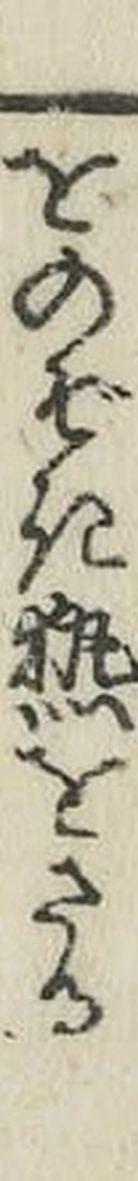をのぞき熱をさる
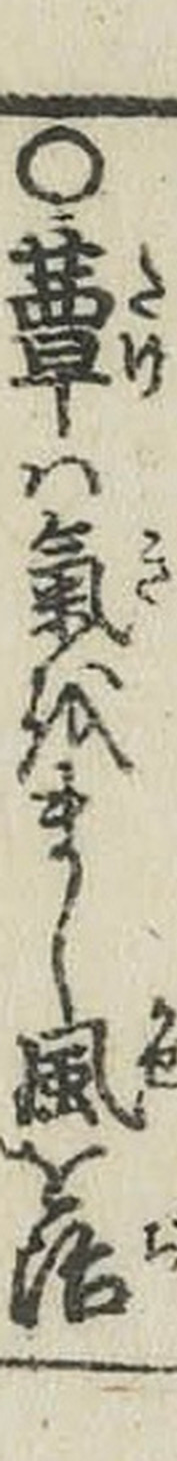○蕈は気をまし風を治
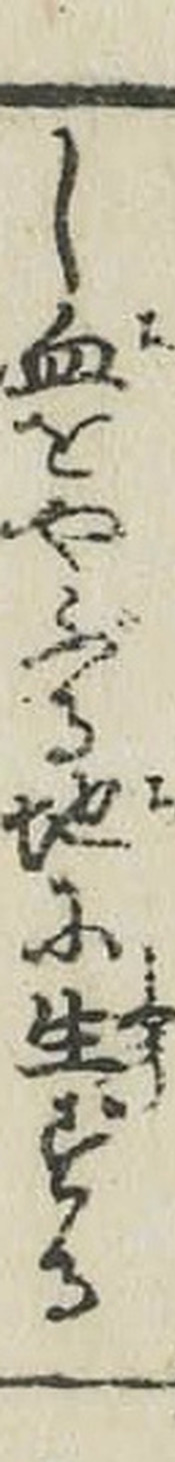し血をやぶる地に生ずる
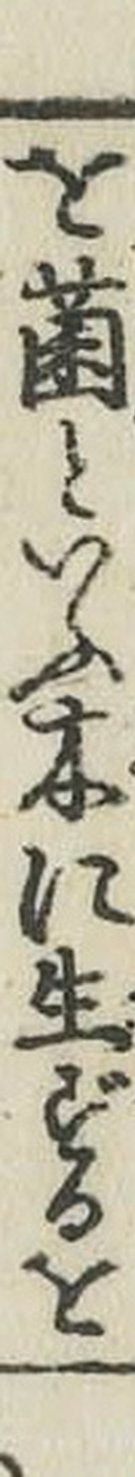を菌といふ木に生ずるを
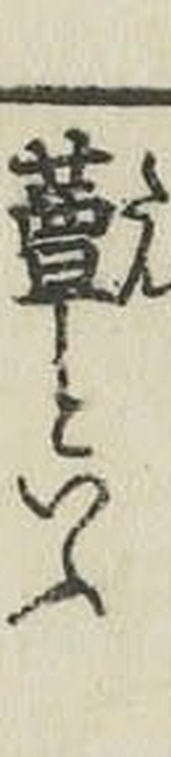蕈といふ
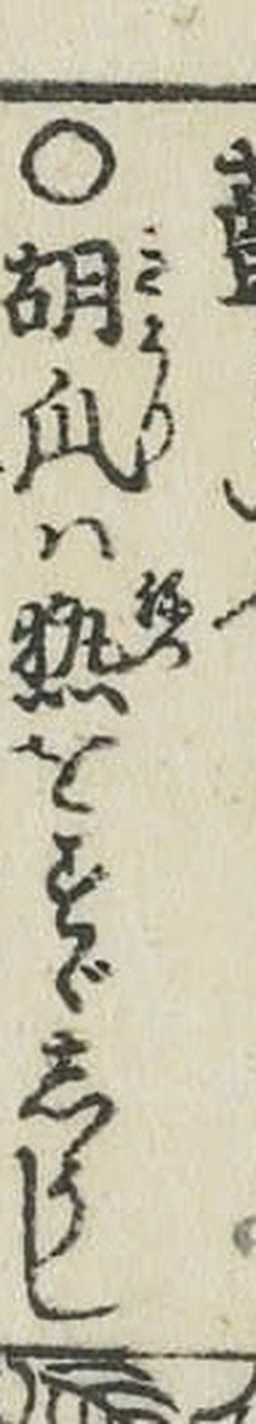○胡瓜は熱をすゞしうし
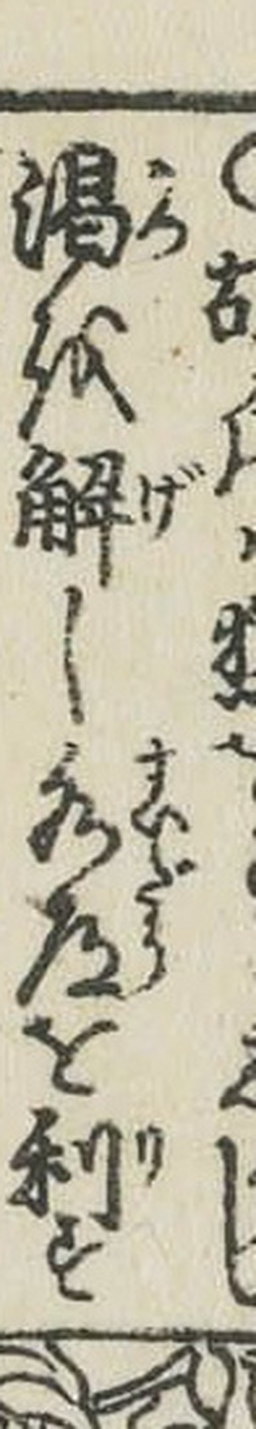渇を解し水道を利す
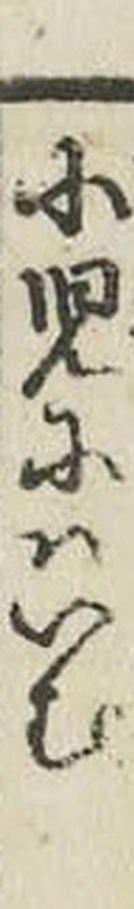小児はいむ
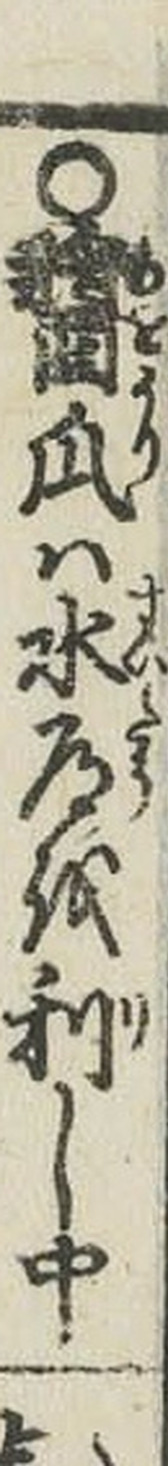○醤瓜は水道を利し中
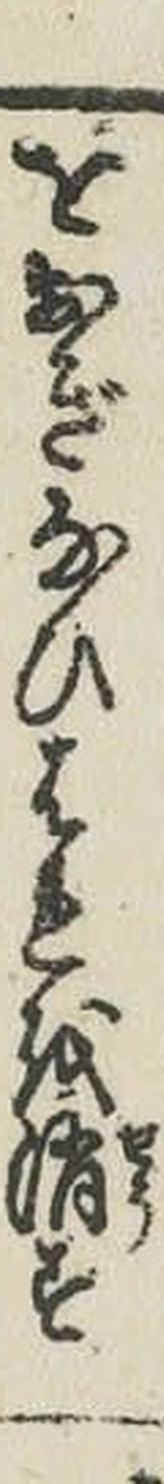をおぎなひはれを消す
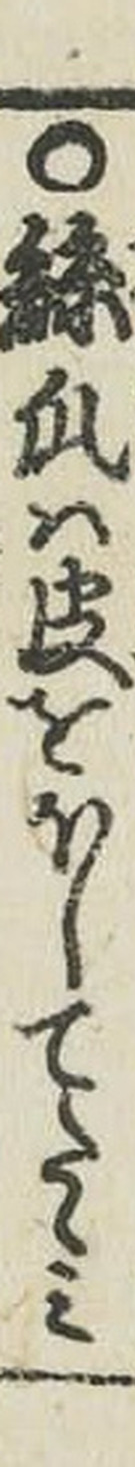○絲瓜は皮をほしてたゝみ
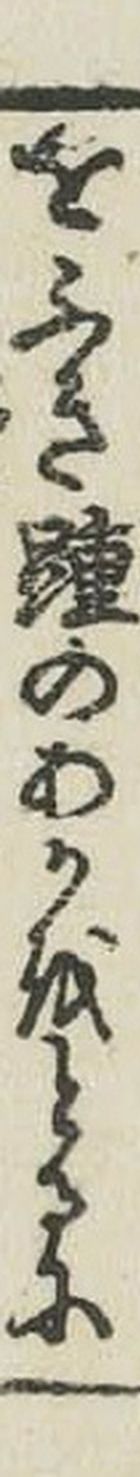をふき踵のあかをとるに
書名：増補頭書訓蒙図彙大成 10巻 8:巻之17-19
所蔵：東京学芸大学教育コンテンツアーカイブ
